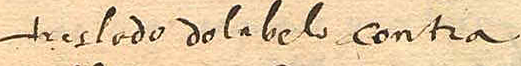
treslado do labelo contra
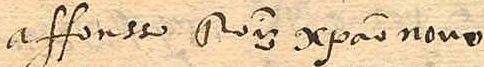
affonsso Ro̅iz xpão nouo
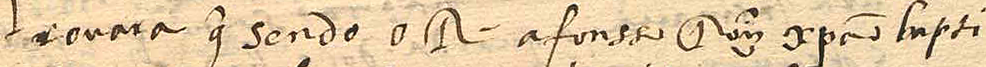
Prouara q̅ sendo o R. afonsso Ro̅iz xpão bapti
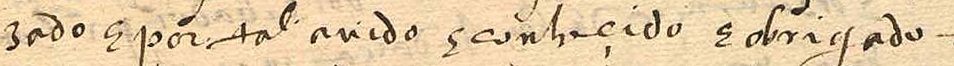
zado E por tal auido E conheçido E obrigado
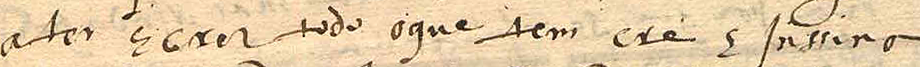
a ter E crer todo o que tem cre E jnssina
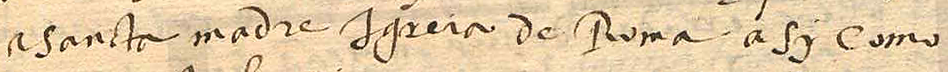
a sancta madre Jgreia de Roma asy como
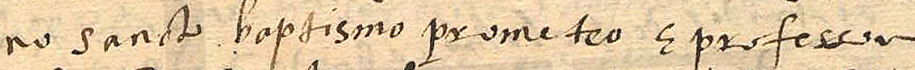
no sancto baptismo prometeo E professou
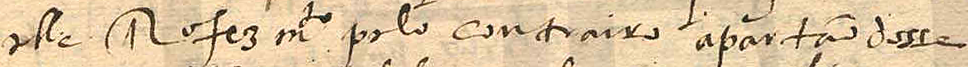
elle R o fez mto pelo contrairo apartãodosse
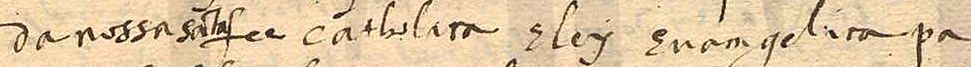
da nossa sa̅ta fee catholica E ley Euangelica pa
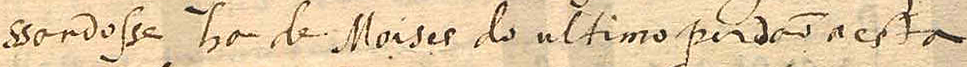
ssandosse ha de Moises do ultimo perdão a esta
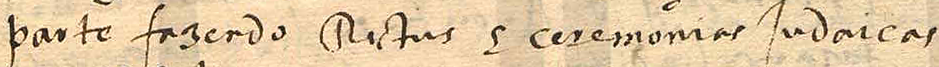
parte fazendo Rictus E ceremonias judaicas
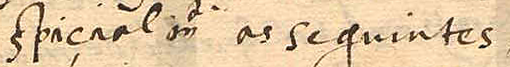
spiçialmte as seguintes.
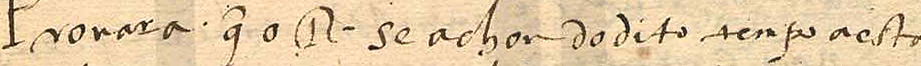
Prouara q̅ o R. se achou do dito tempo a esta
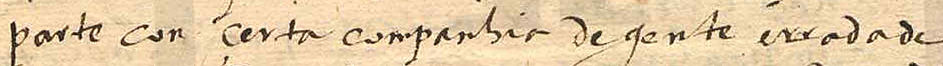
parte com çerta companhia de gente errada de
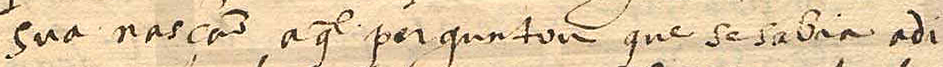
sua nasção a q̄l perguntou que se sabia a di
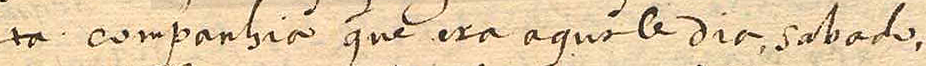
ta companhia que era aquele dia sabado,
